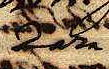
Raza
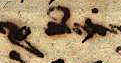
0_7
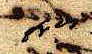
tr.os
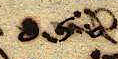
050
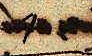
4_
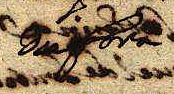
Dia fora
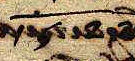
1583
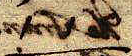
100
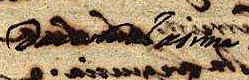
D_ _õ asima
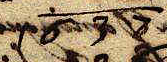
1637
